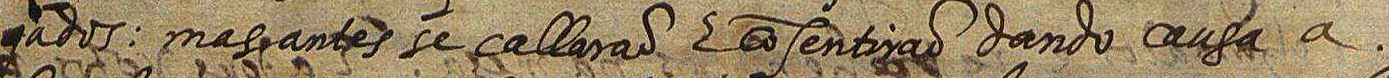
gados: mas antes se callaraõ E cōsentiraõ dando causa a
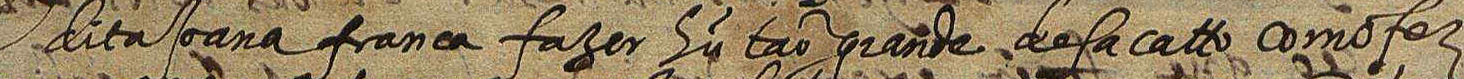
dita Joana franca fazer hū taõ grande desacatto como fez
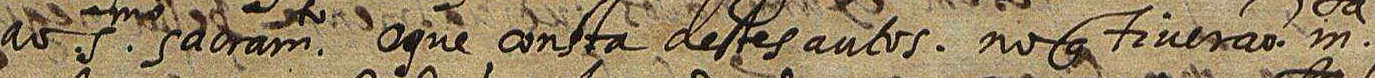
ao smo. sacram.to o que consta destes autos. no q̄ tiuerão mta.
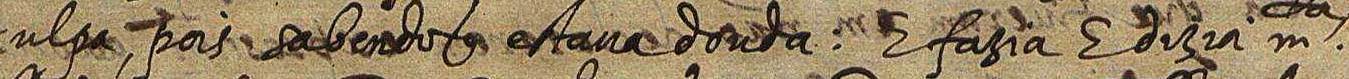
culpa, pois sabendo q̄ estaua douda: E fazia E dizia mtas.
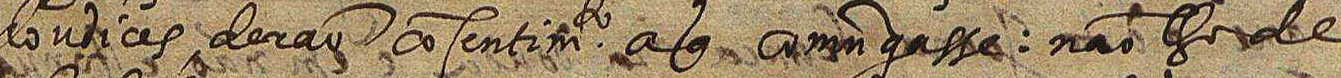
doudices, deraõ cōsentimto. a q̄ comūgasse: não lho de
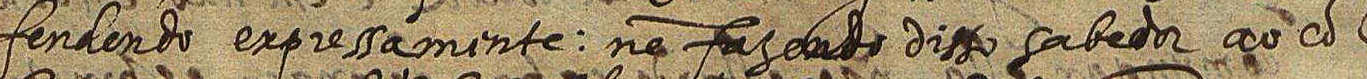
fendendo expressamente: nē fazendo disso sabedor ao cō
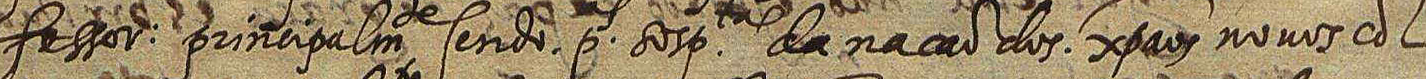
fessor: principalmte sendo. pas. sosp.tas da nacaõ dos xpãos nouos cō
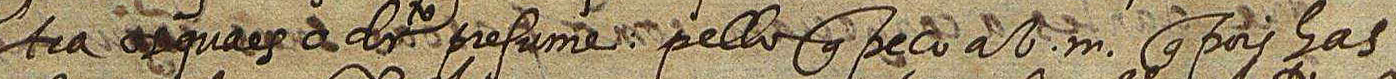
tra os quaes o dr.to presume: pello q̄ peço a v. m. q̄ pois has
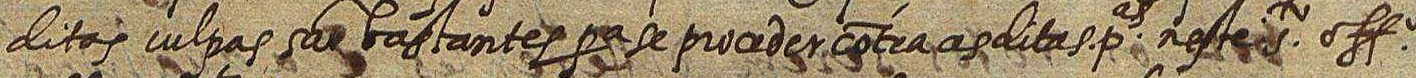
ditas culpas saõ bastantes ꝑa se proceder cōtra as ditas pas. neste s.to off.o
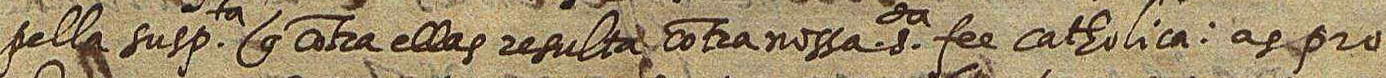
pella susp.ta q̄ cōtra ellas resulta cōtra nossa .s.ta fee catholica: as pro
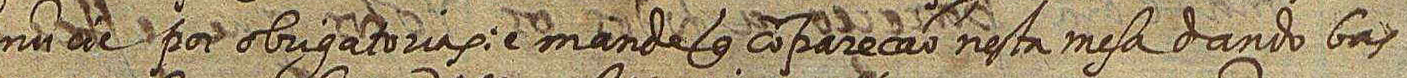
nūcie por obrigatorias: e mande q̄ cōpareçaõ nesta mesa dando bas
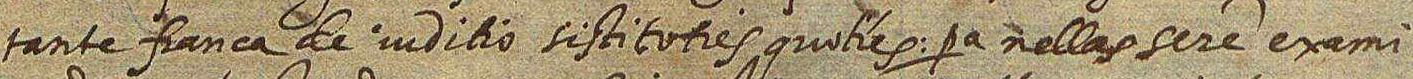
tante fiança de iuditio sisti toties quoties: ꝑa nellas serē exami
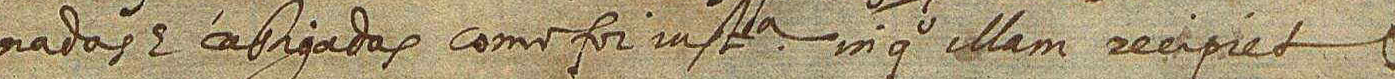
nadas E castigadas como for iusta. in qo illam recipiet
